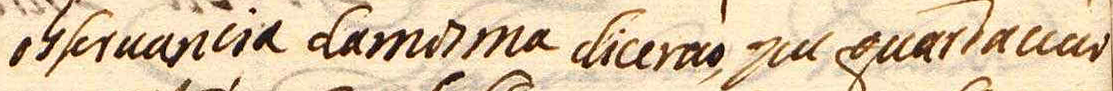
obseruancia da mesma diceraō, que guardauaõ
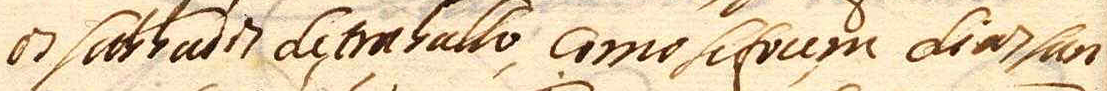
os sabbados de trabalho como se foçem dias san
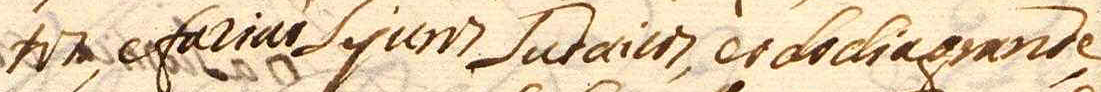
tos, e faziaō Iejuns Iudaicos, e o do dia grande,
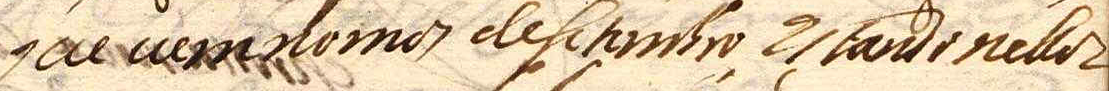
que uem no mes de setembro, Estando nellez
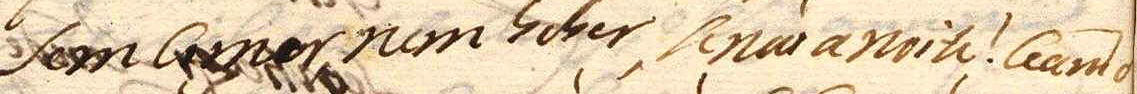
sem comer nem beber, senaõ a noite! Ceando
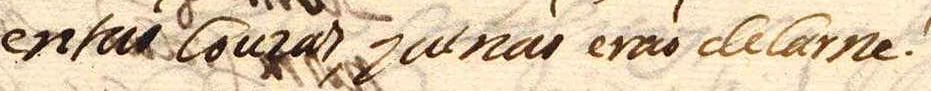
entaõ Couzas, que naõ eraõ de Carne!
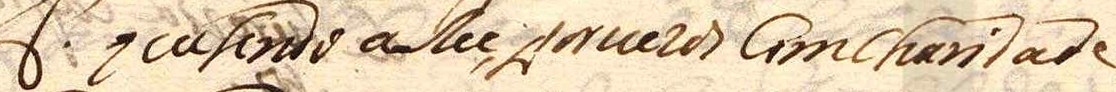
P. que sendo a Ree, por uezes Com charidade
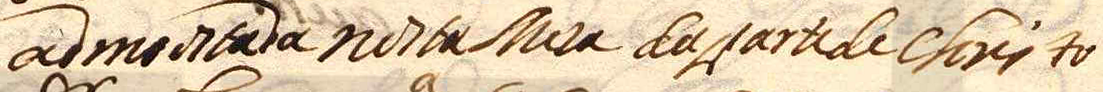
admoestada nesta Meza da parte de christo
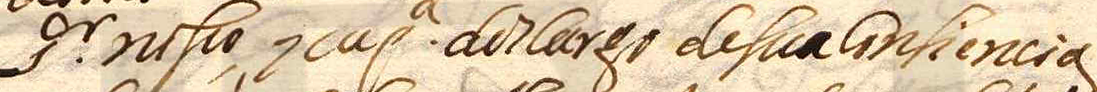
s.or nosso, que p.a desCargo de sua consiencia
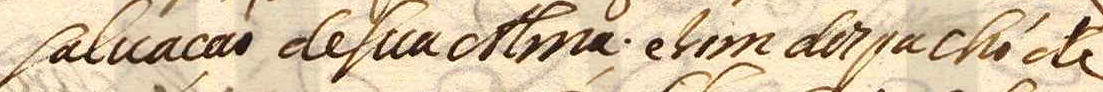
saluaçaõ de sua Alma e bom despacho de
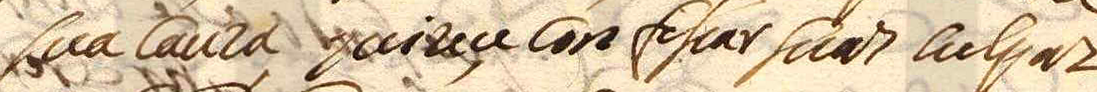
sua cauza, quizeçe confessar suas culpaz
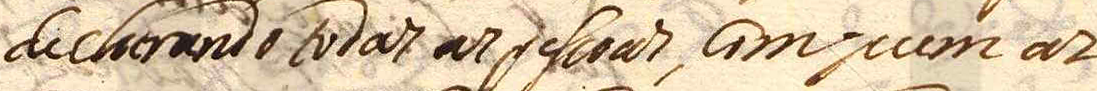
declarando todas as pessoas, com quem as
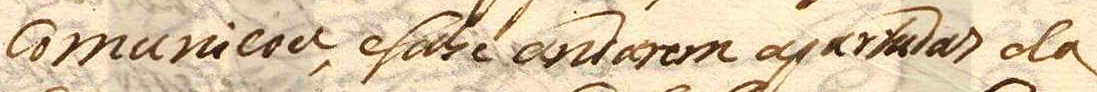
comunicou, e sabe andarem apartadas da
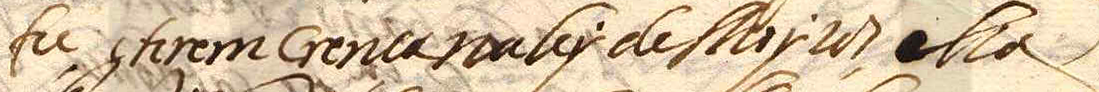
fee, e terem crença na ley de Moyzes, ella
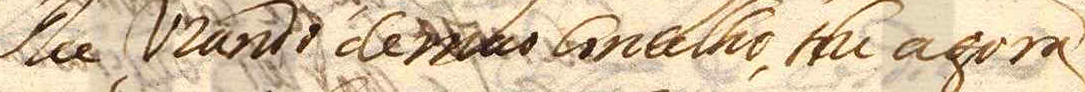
Ree Vzando de mao Concelho, the agora
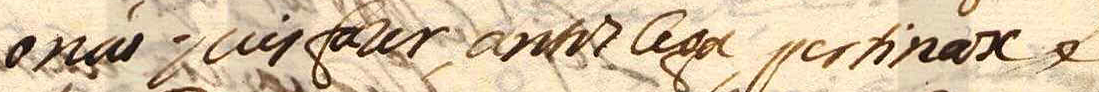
o naõ quis fazer, antes Cega, pertinax e
